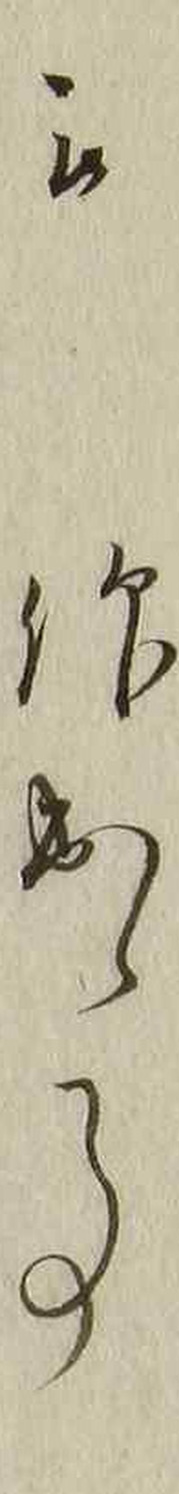被仰出候事
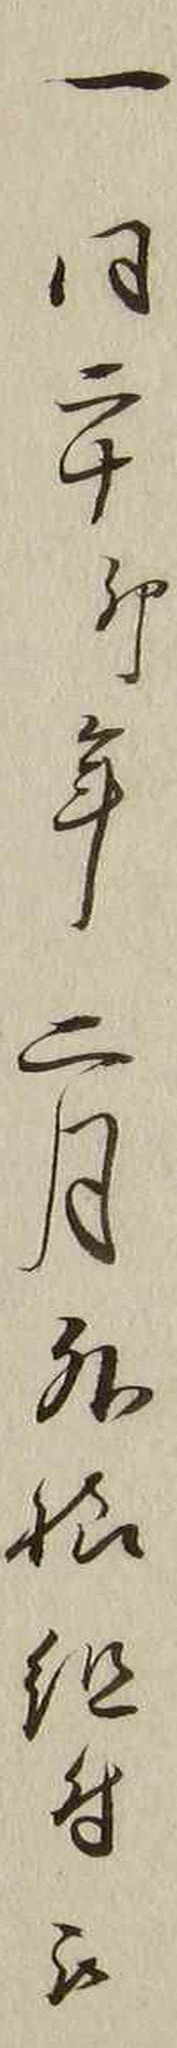一同二十卯年二月外様組付被
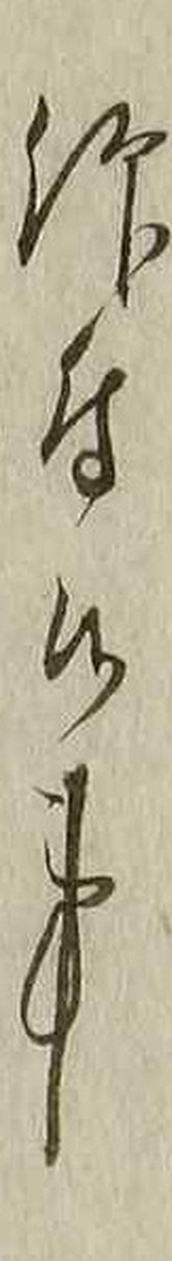仰付候事
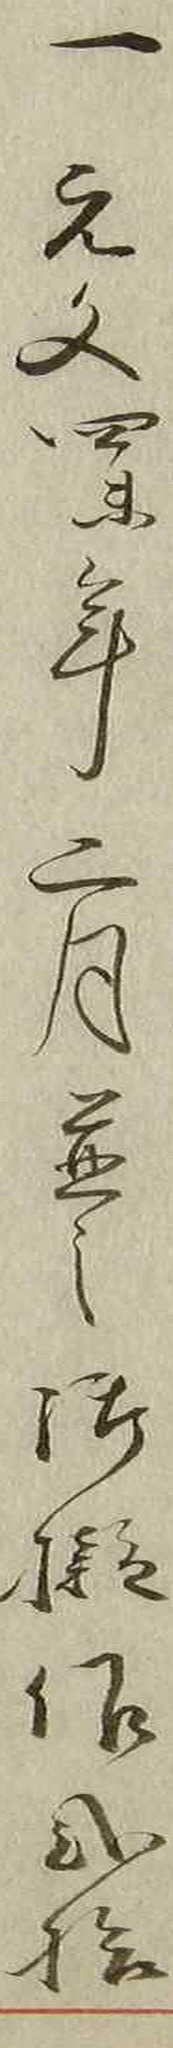一元文四未年二月並之御擬作弐拾
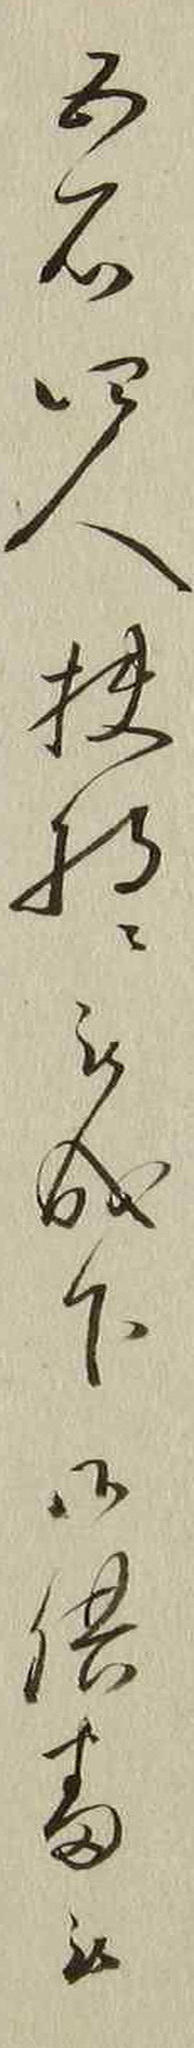五石四人扶持ニ被成下御供番被
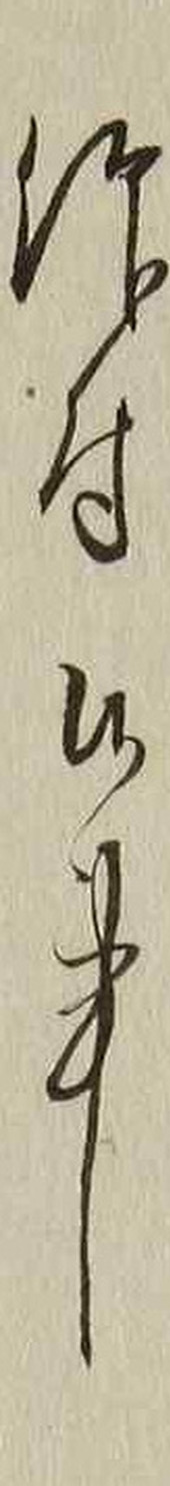仰付候事
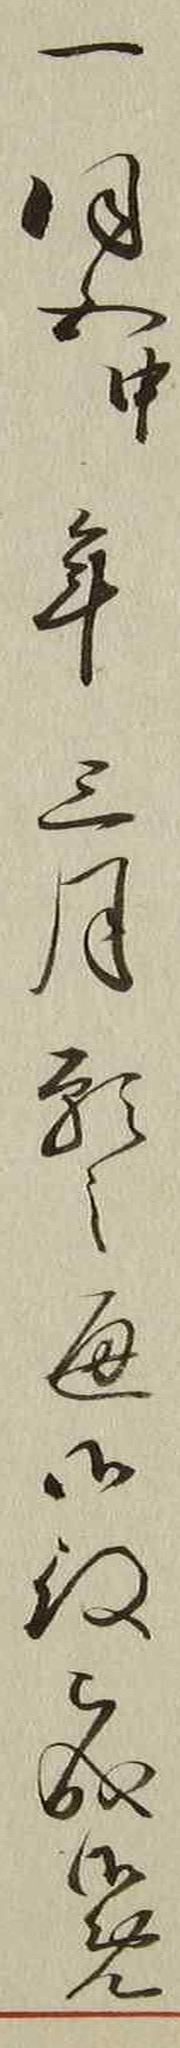一同五申年三月願之通御役被成御免
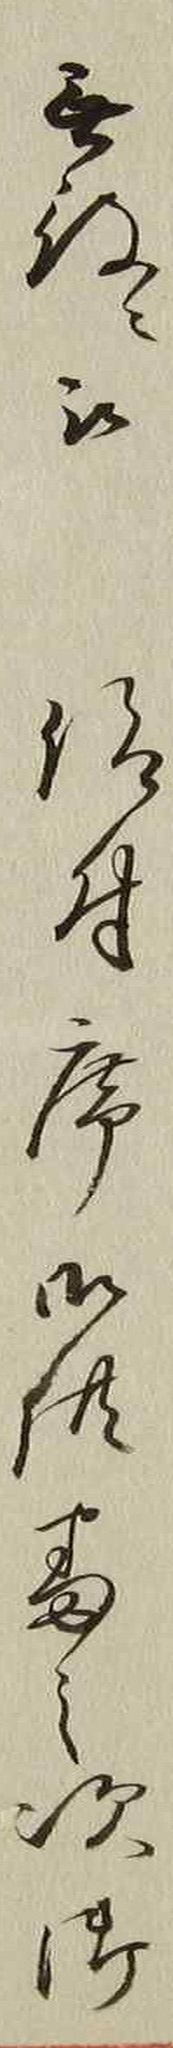無役被仰付席御供番之次御
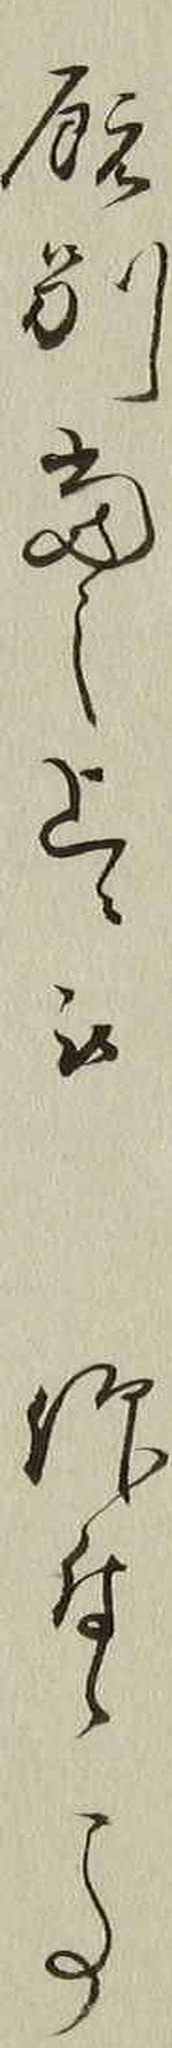厩別当之上ニ被仰付候事
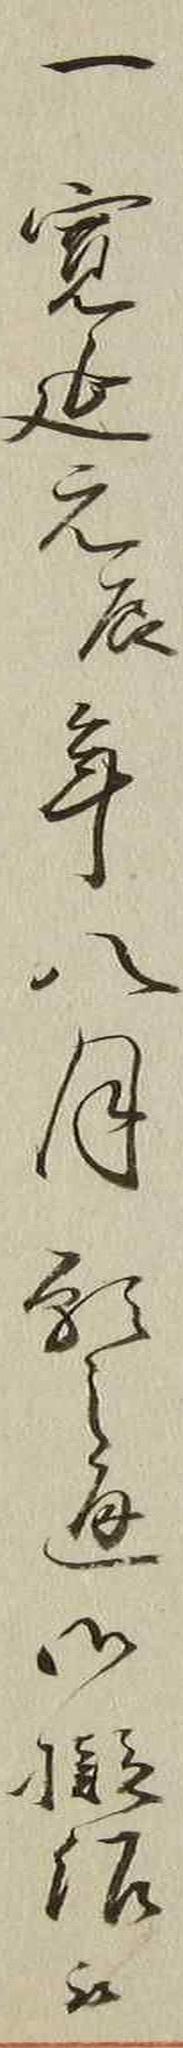一寛延元辰年八月願之通御擬作被
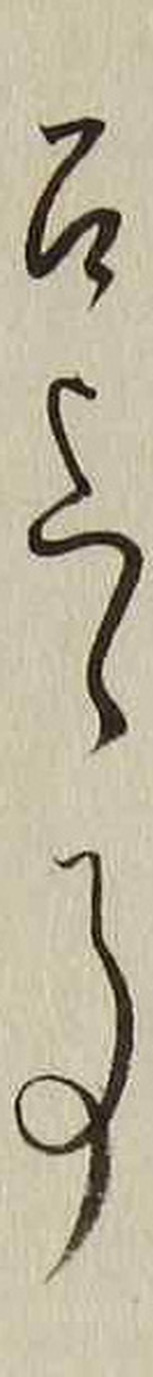召上候事
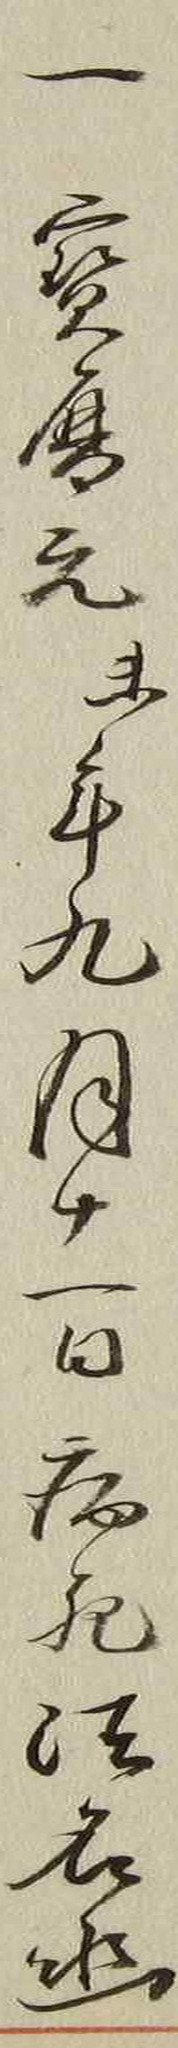一宝暦元未年九月十一日病死法名幽
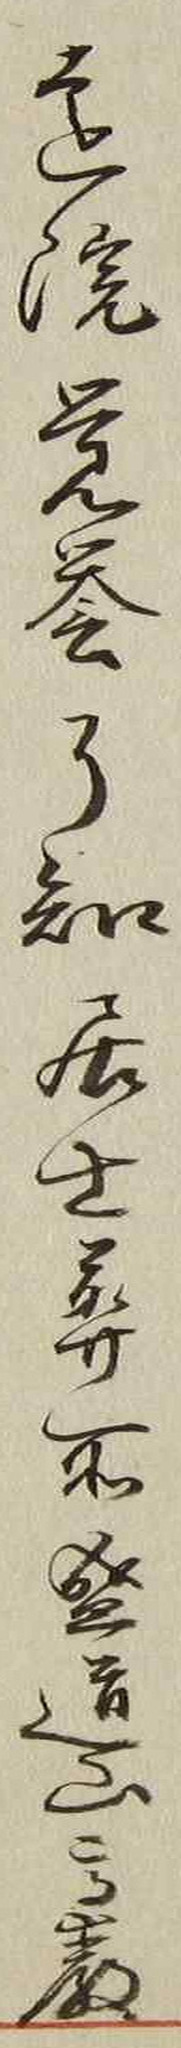遠院覚誉了知居士葬所盛道山高厳
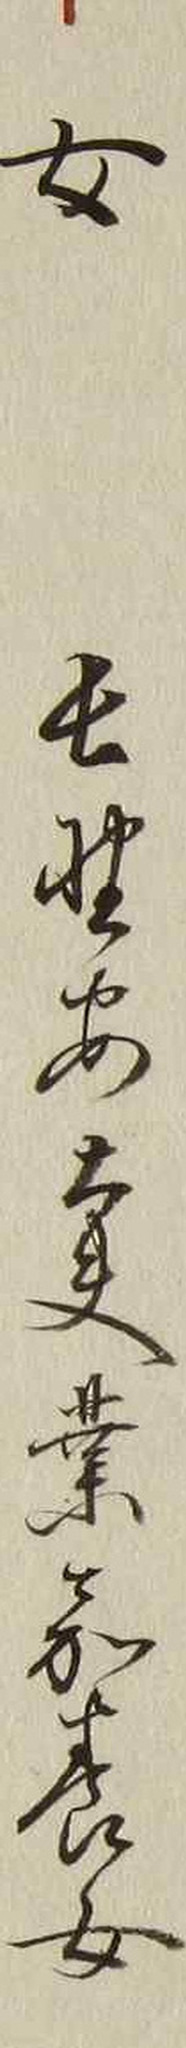女長野安大夫業嘉養女
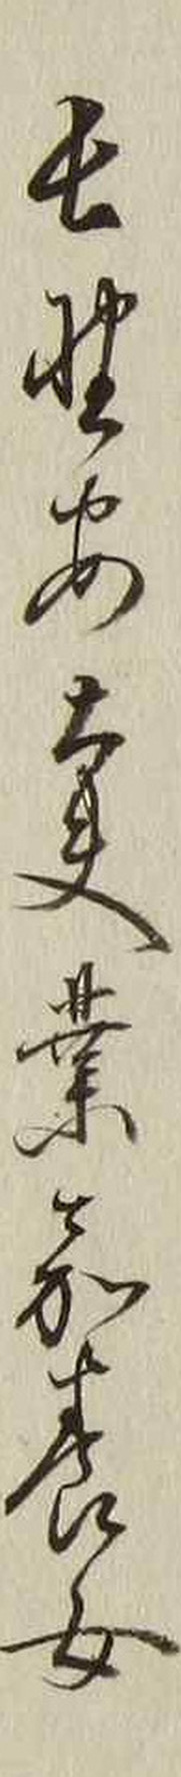女長野安大夫業嘉養女
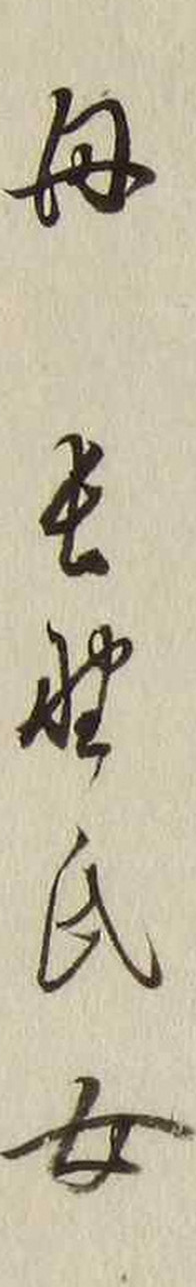母長野氏女
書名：諸士系譜　巻之28　い之部28
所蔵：会津若松市立会津図書館
